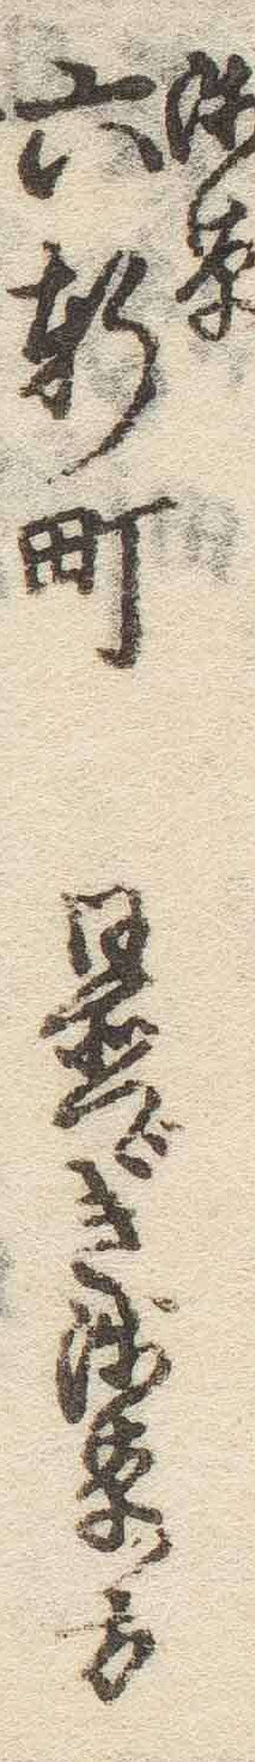六軒町同所つゞき浅草方
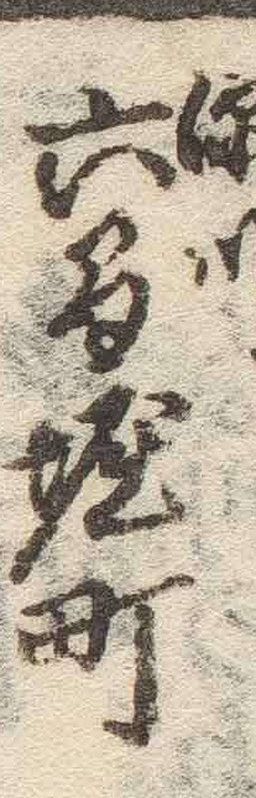六間堀町
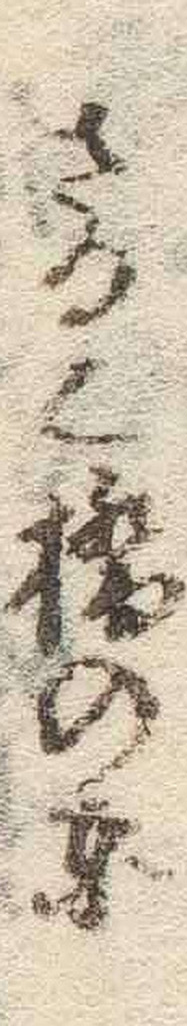さるこ橋の東
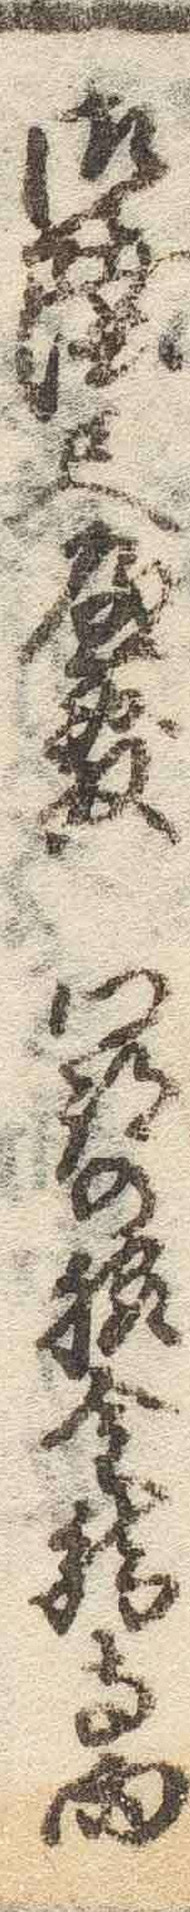御陸尺屋敷門跡の脇金龍寺向
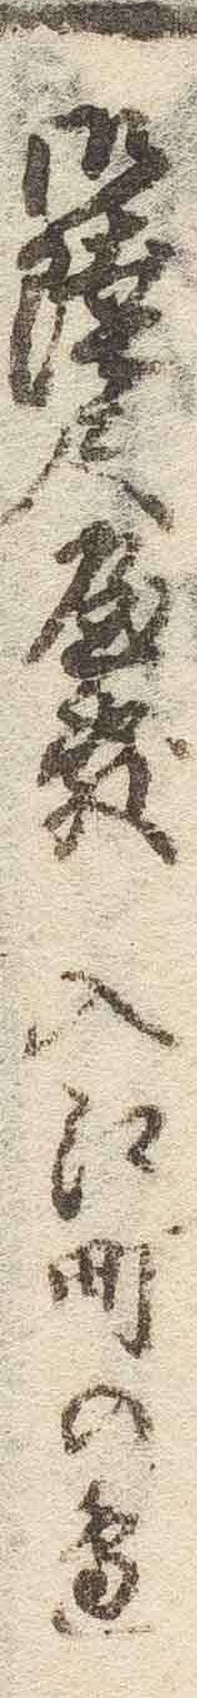御陸尺屋敷入江町の辺
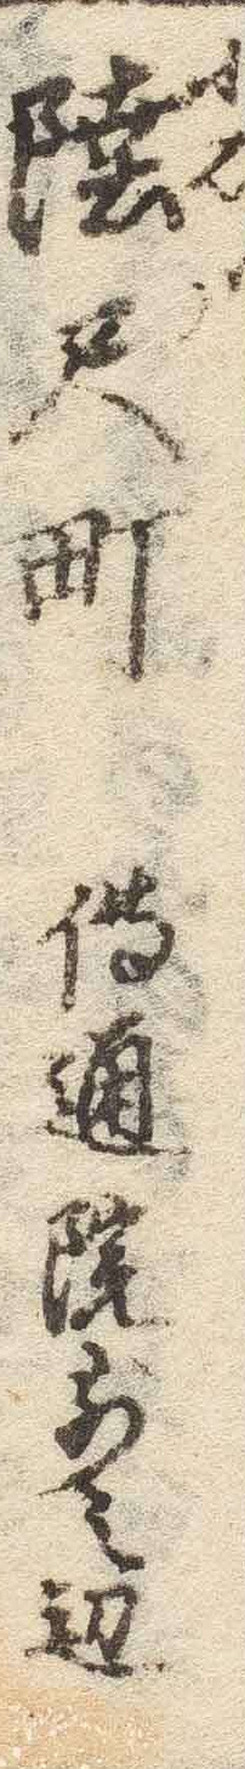陸尺町伝通院前の辺
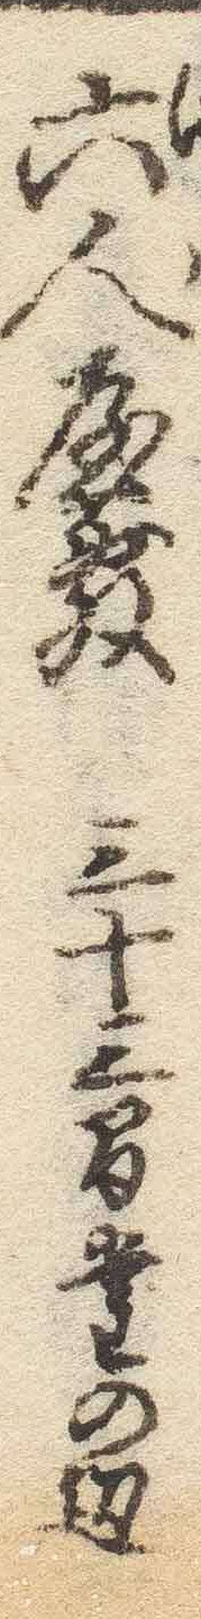六人屋敷三十三間堂の辺
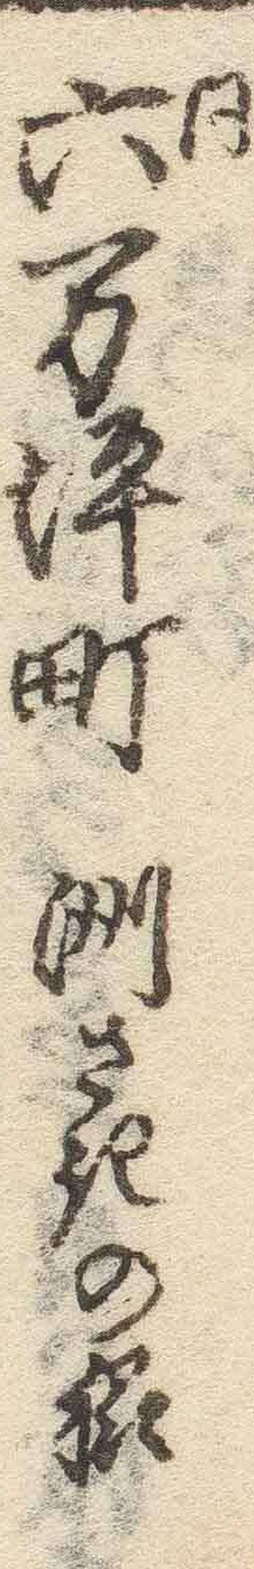六万坪町洲さきの脇
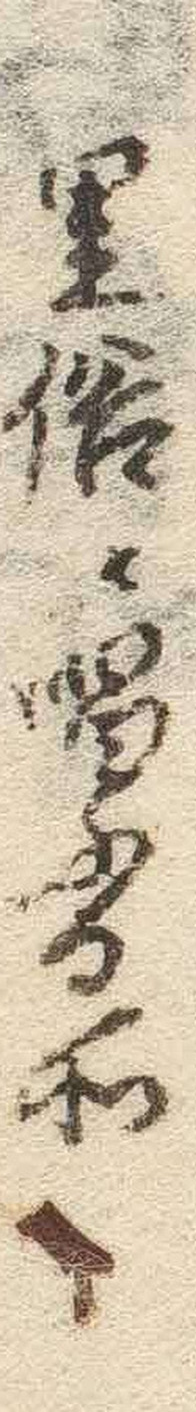里俗に唱ふる所
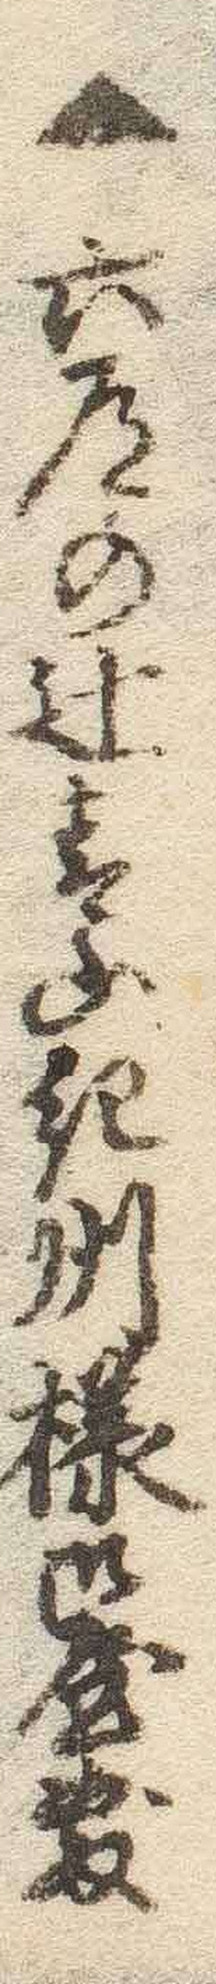▲六道の辻青山紀州様御屋敷
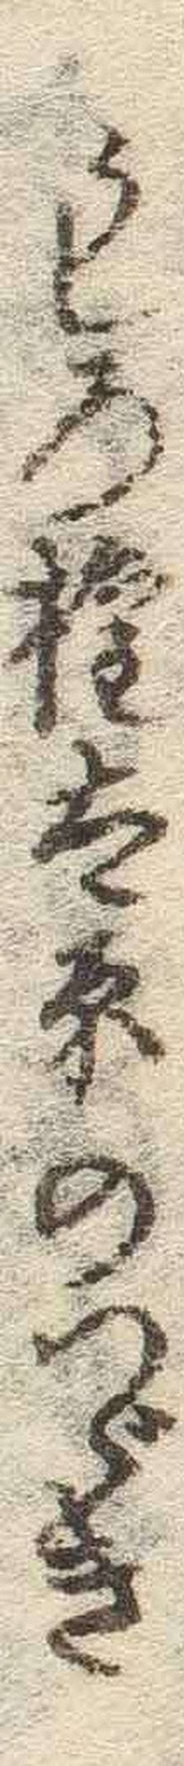うしろ権太原のつゞき
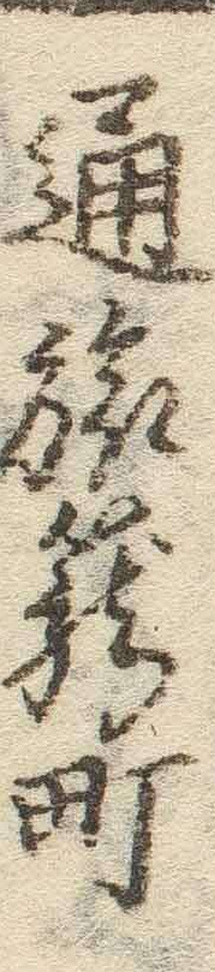通旅籠町
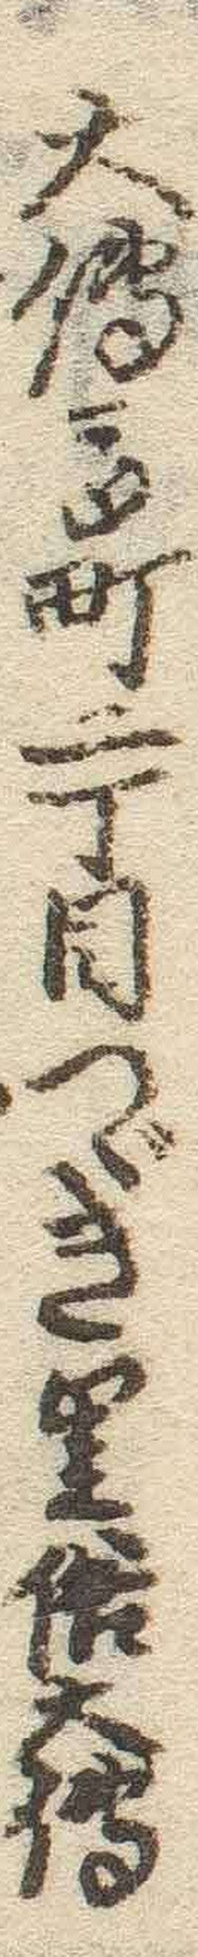大伝馬町二丁目つゞき里俗大伝
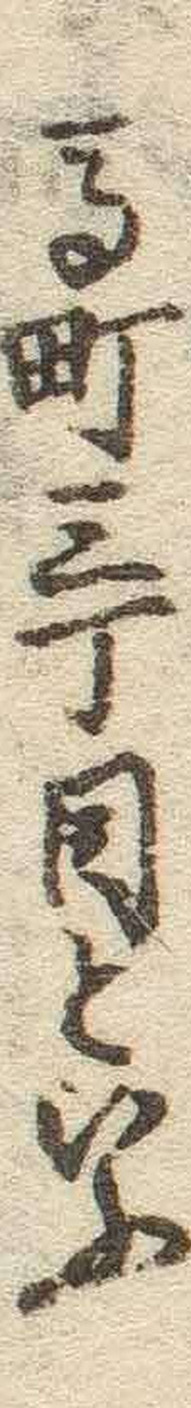馬町三丁目といふ
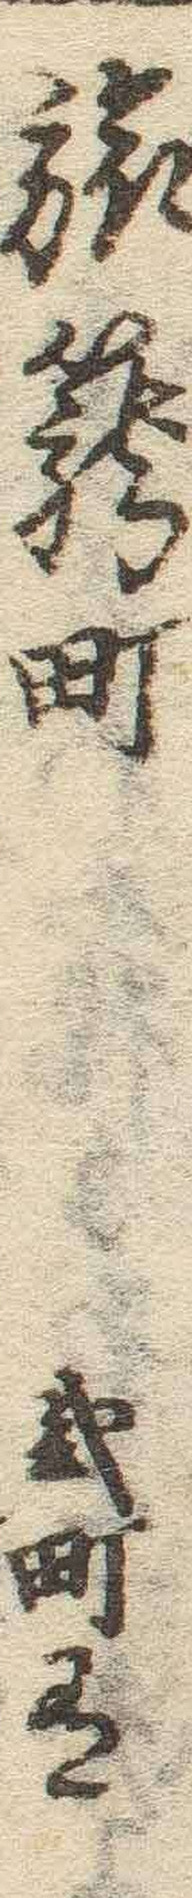旅籠町弐町有
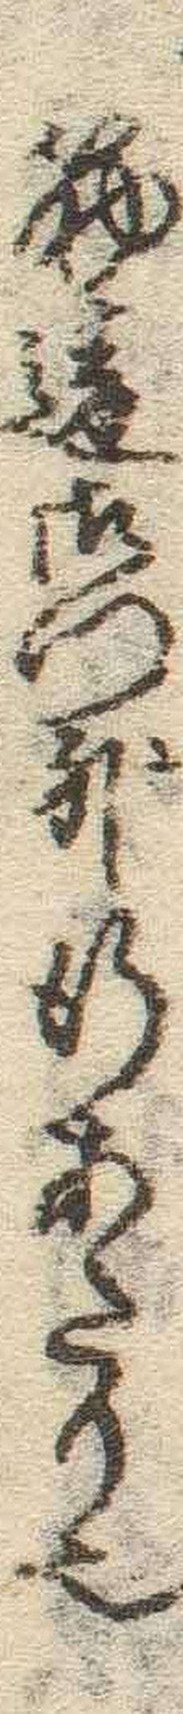筋違御門外行あたり也
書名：江戸町独案内
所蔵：東京学芸大学附属図書館 国文学研究資料館
